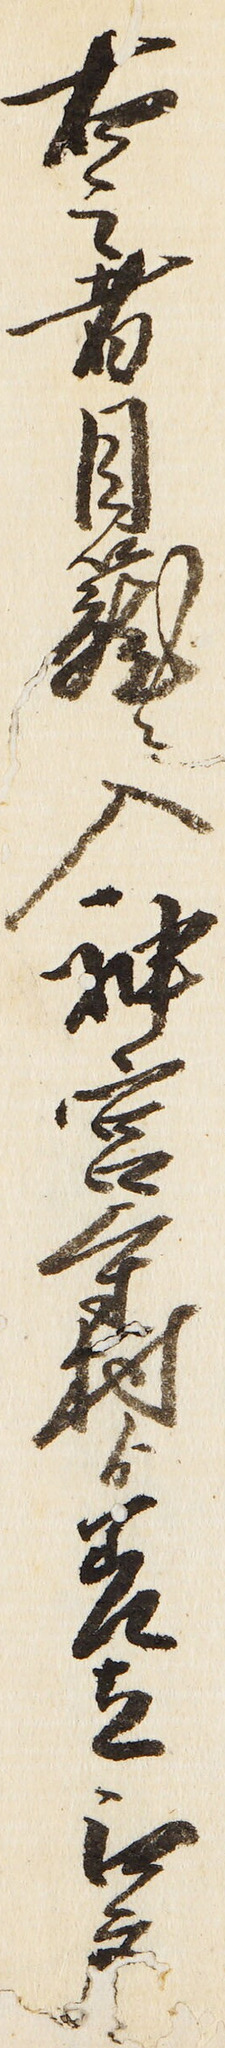右之者目籠ニ入神宮寺村ゟ差立江戸
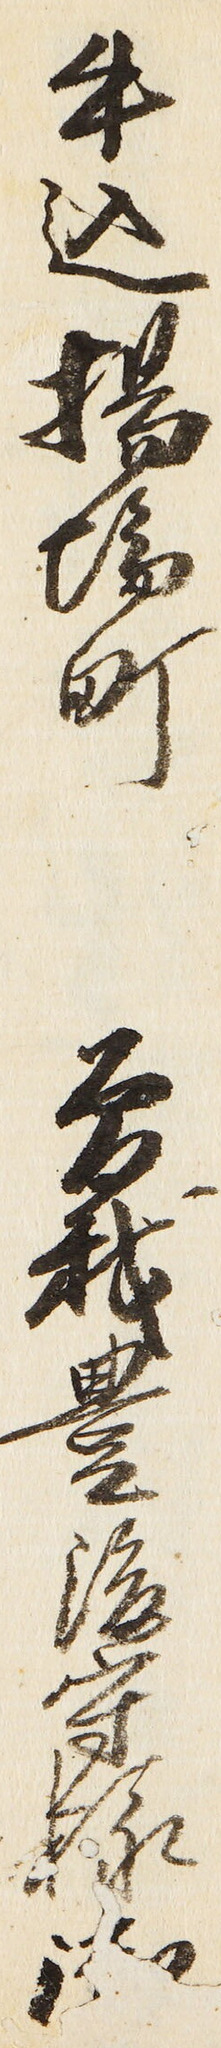牛込揚場町曾我豊後守様御
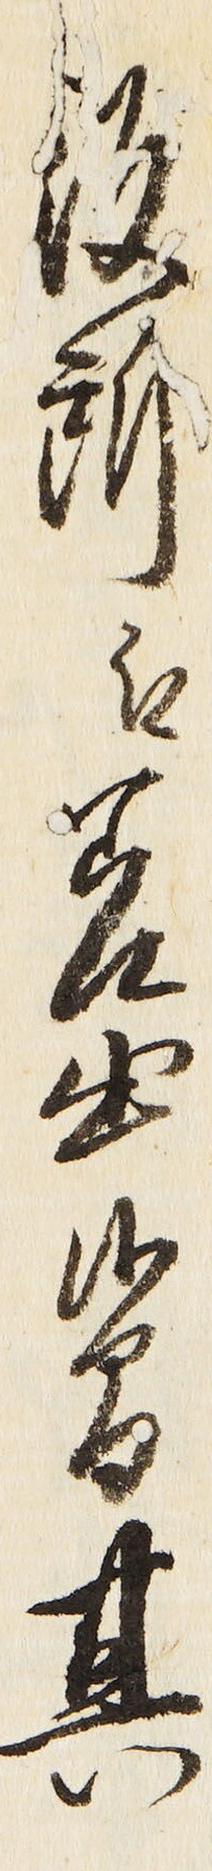役所江差出候間其
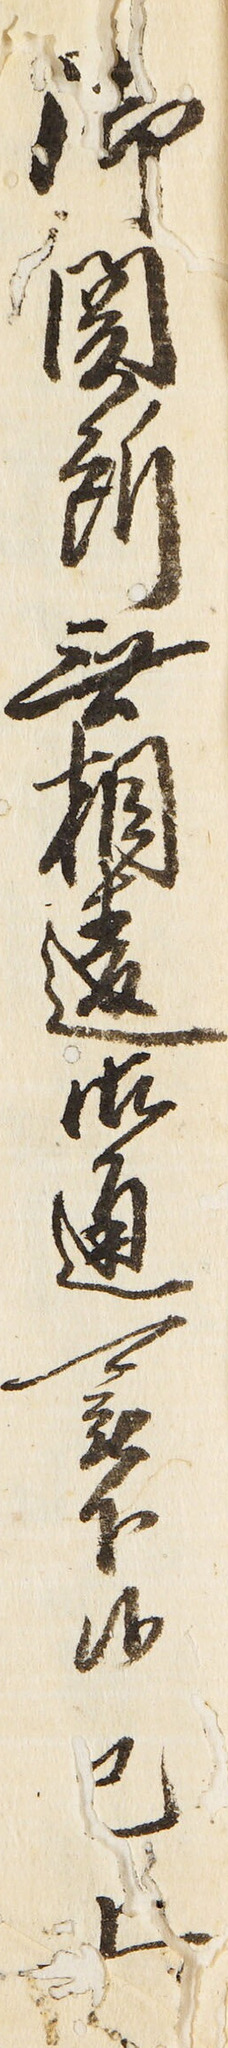御関所無相違御通可被下候已上
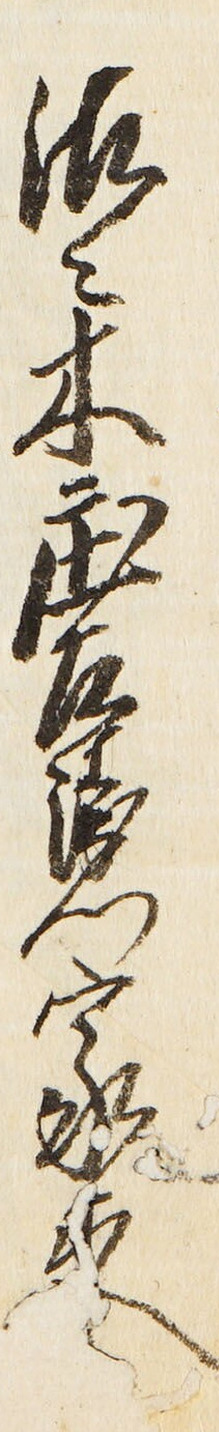佐々木庄左衛門知行
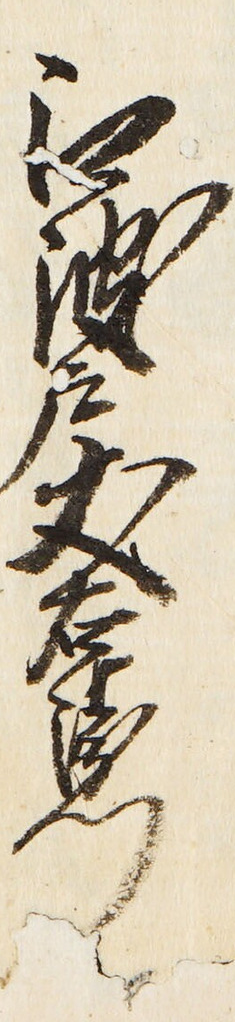江波戸丈右衛門
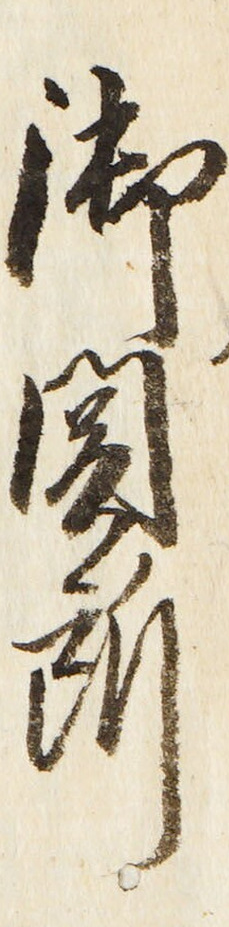御関所
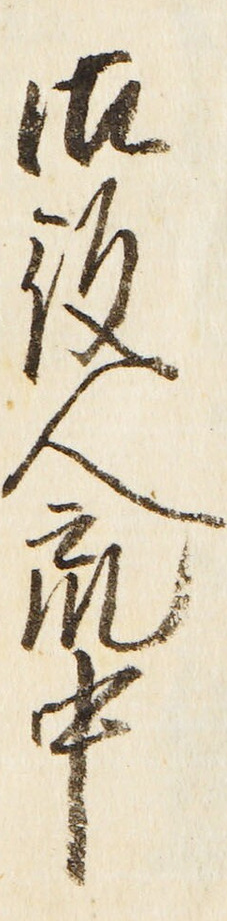御役人衆中

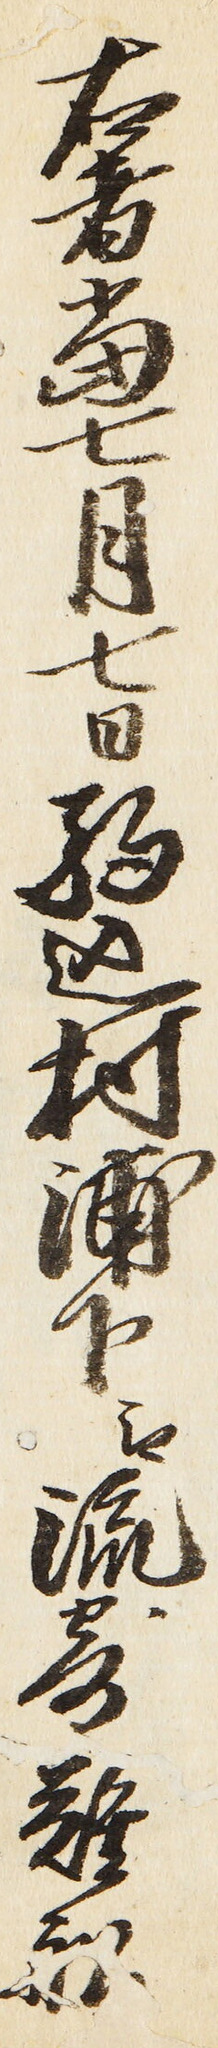右者当七月七日駒込村浦下江流寄難船
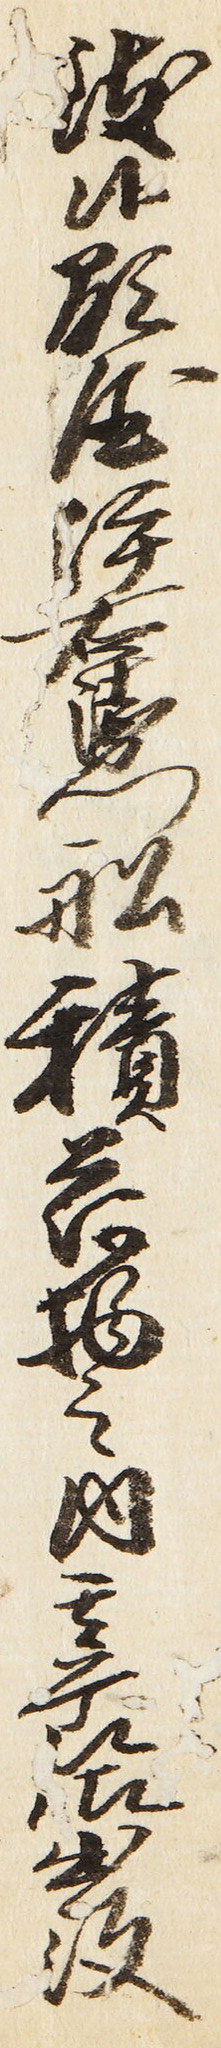致候顕屋伊右衛門船積荷物之内其節御出役
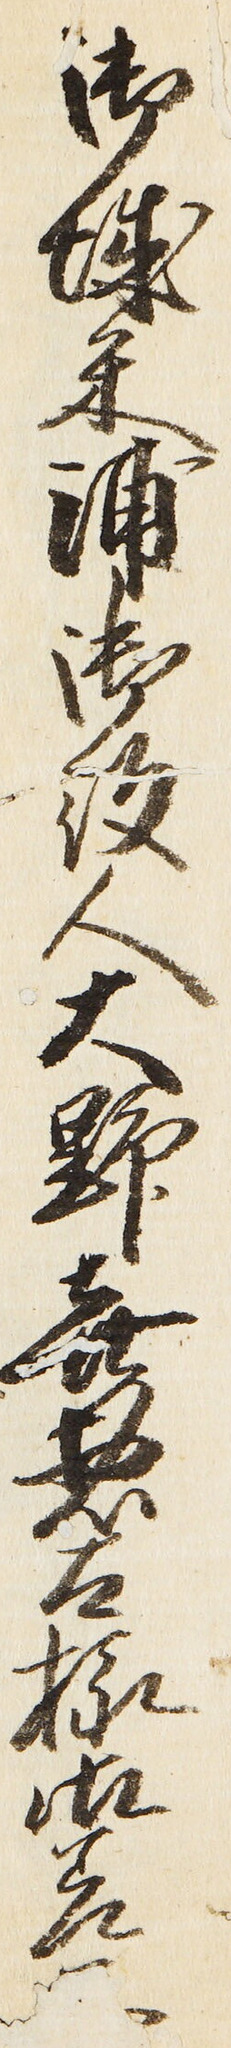御城米浦御役人大野喜惣太様御差
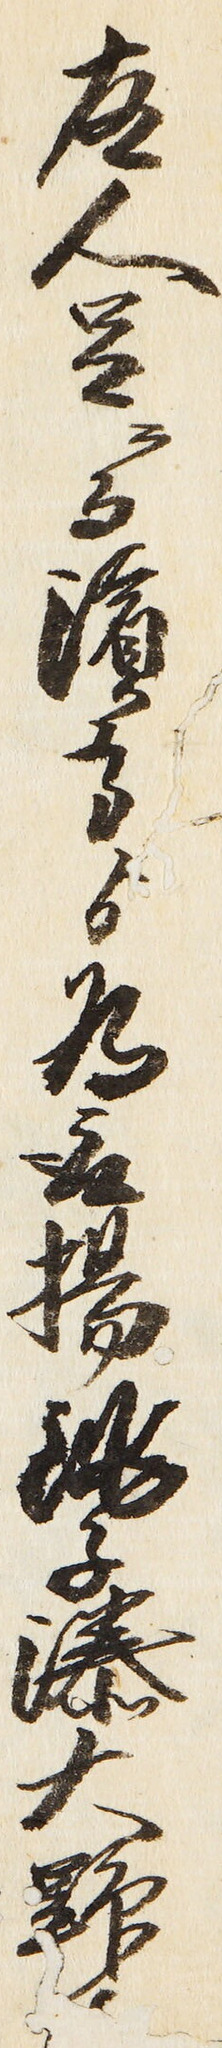故人足ニ而浜方ゟ為取揚銚子湊大野
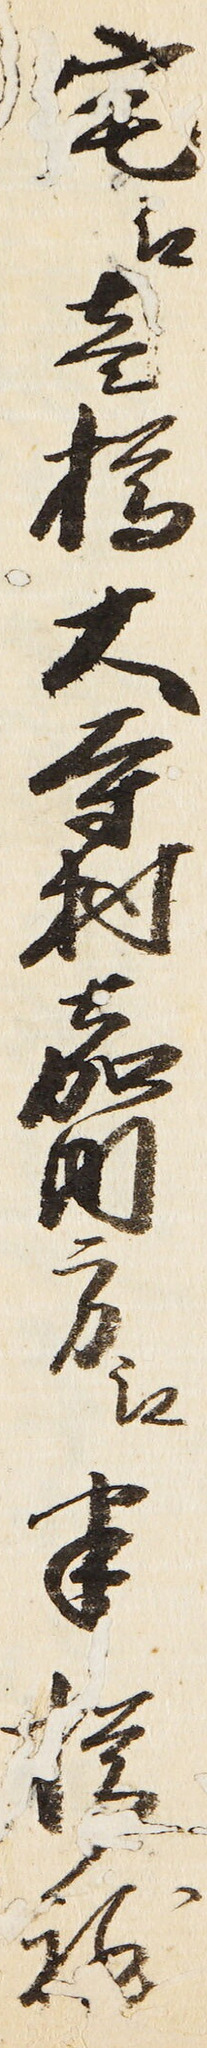宅江壱樽大寺村嘉町方江半樽程
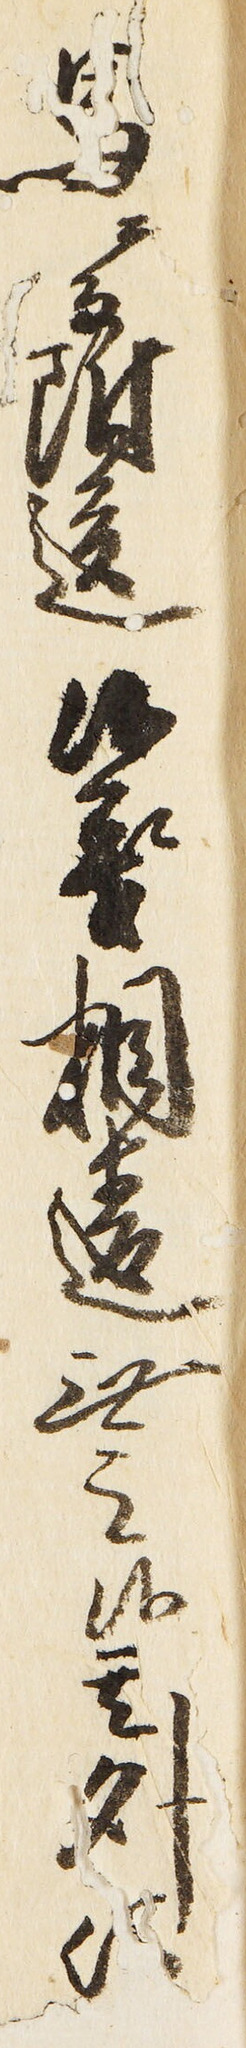馬ニ而付送候義相違無之候其外
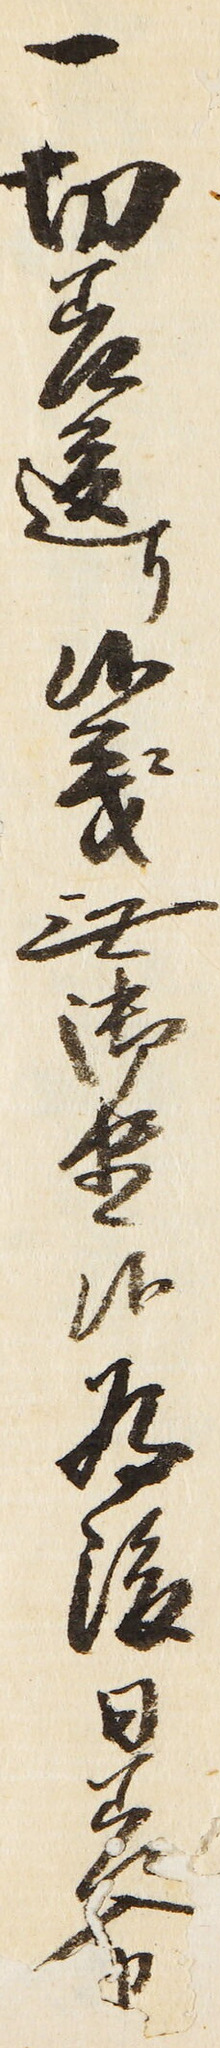一切差送り候義無御座候為後日差入申
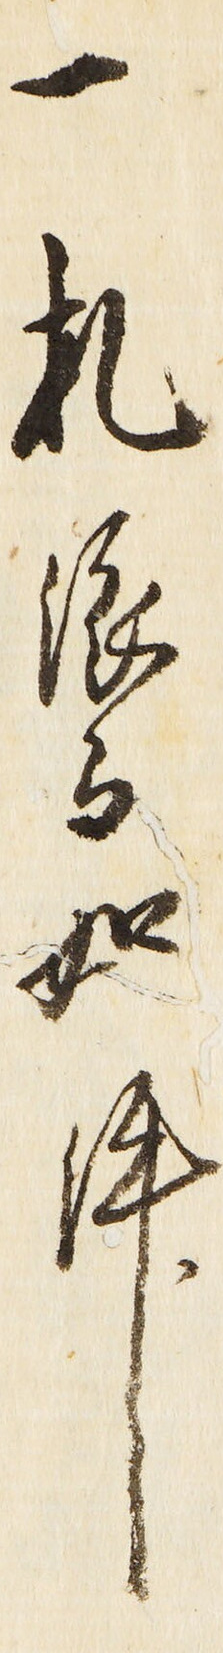一札依而如件
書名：難船一件記録
